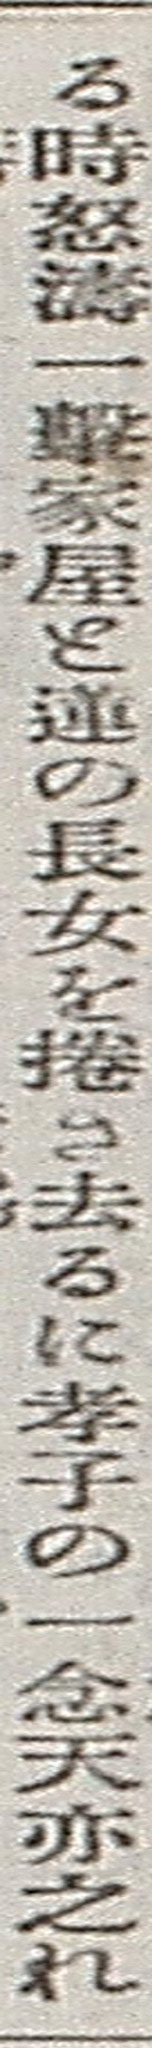る時怒濤一撃家屋と蓮の長女を捲き去るに孝子の一念天亦之れ
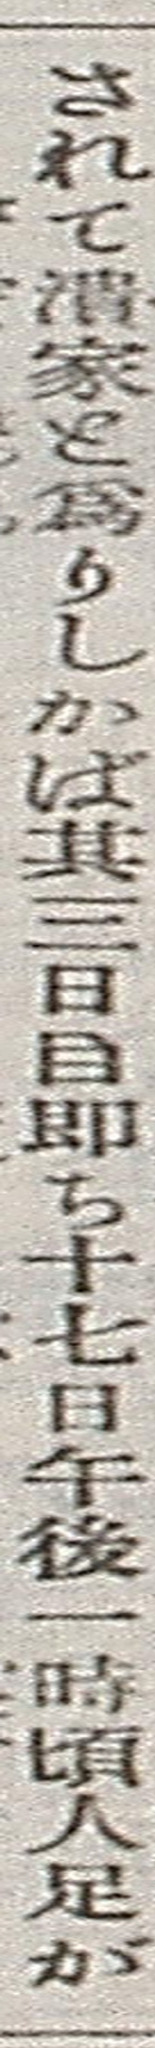されて潰家と為りしかば其三日目即ち十七日午後一時頃人足が
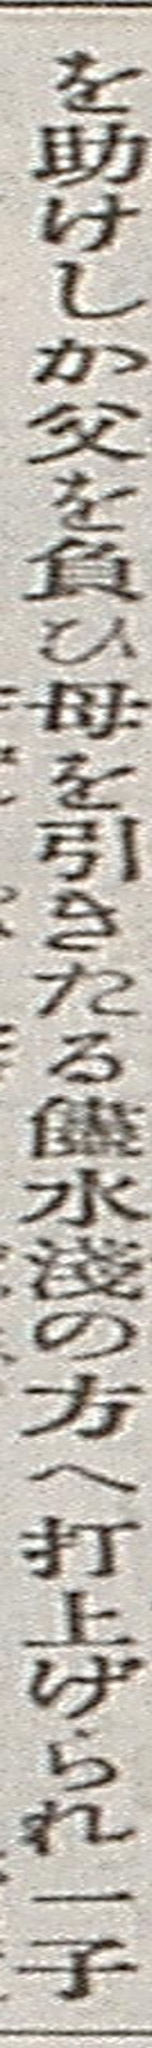を助けしか父を負ひ母を引きたる侭水浅の方へ打上げられ一子
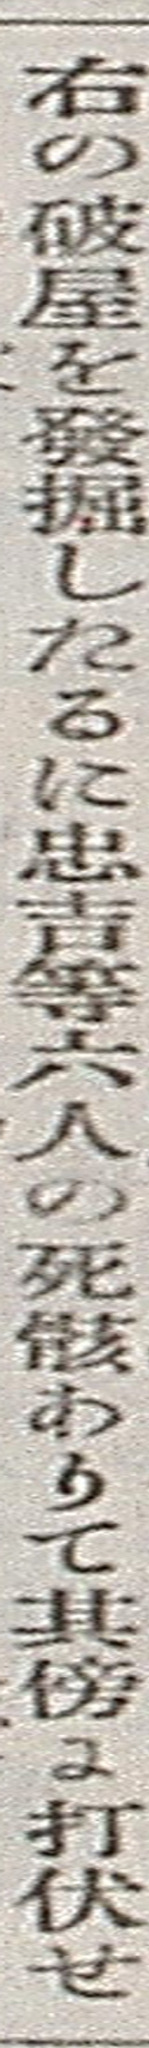右の破屋を発掘したるに忠吉等六人の死骸ありて其傍に打伏せ
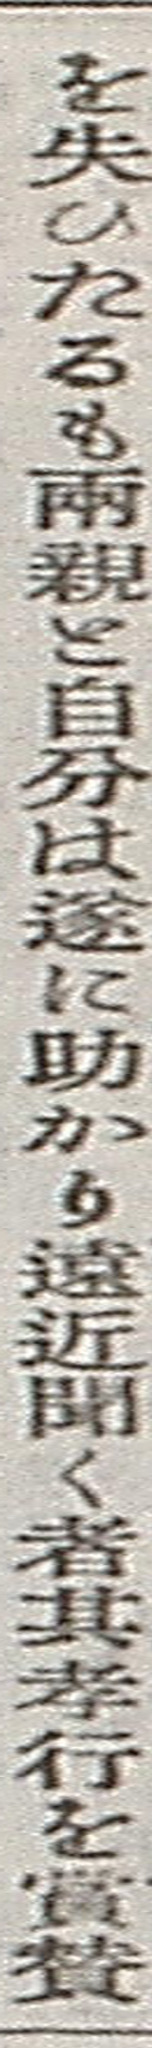を失ひたるも両親と自分は遂に助かり遠近聞く者其孝行を賞賛
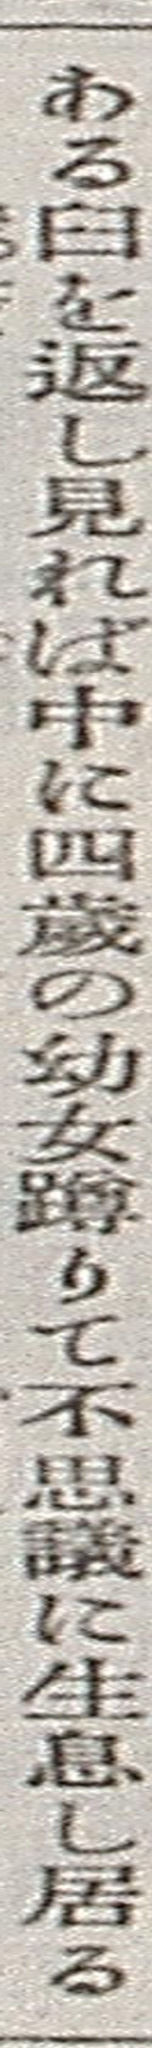ある臼を返し見れば中に四歳の幼女蹲りて不思議に生息し居る
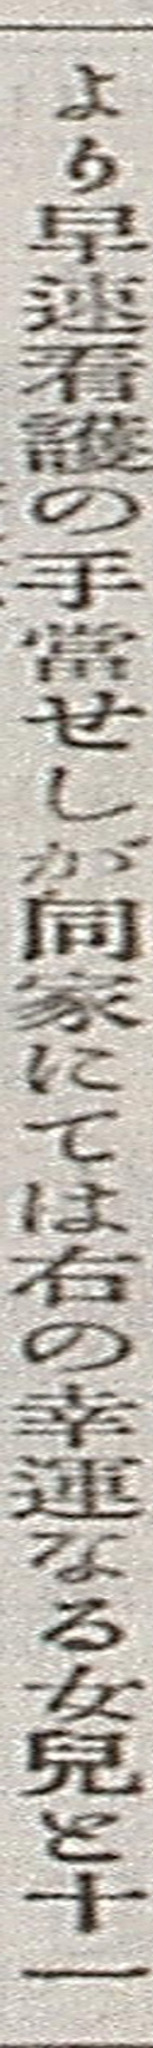より早速看護の手当せしが同家にては右の幸運なる女兒と十一
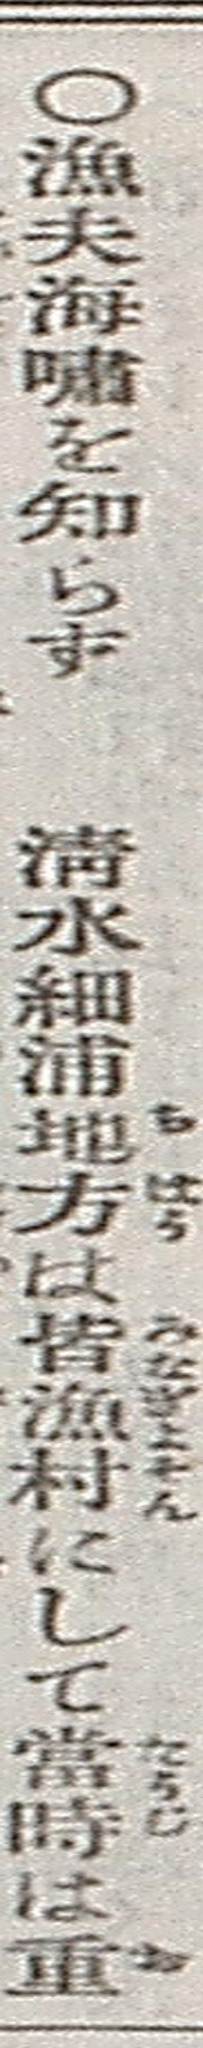○漁夫海嘯を知らず清水細浦地方は皆漁村にして当時は重
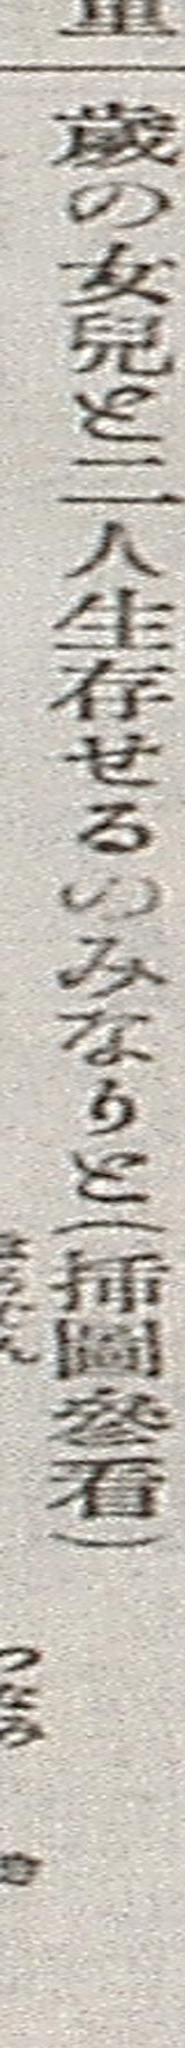歳の女兒と二人生存せるのみなりと
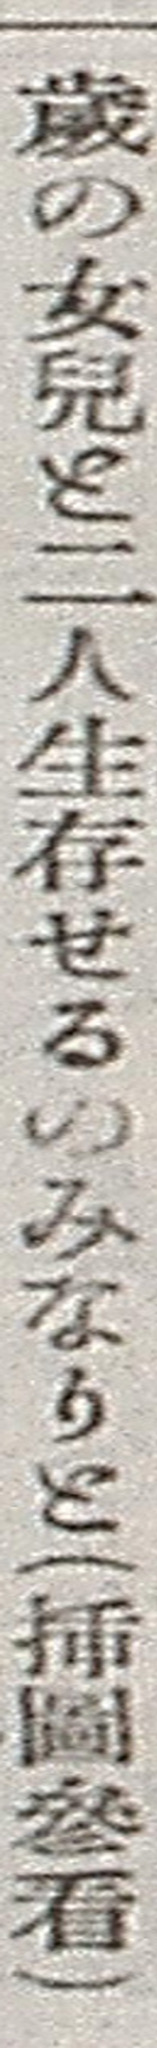歳の女兒と二人生存せるのみなりと
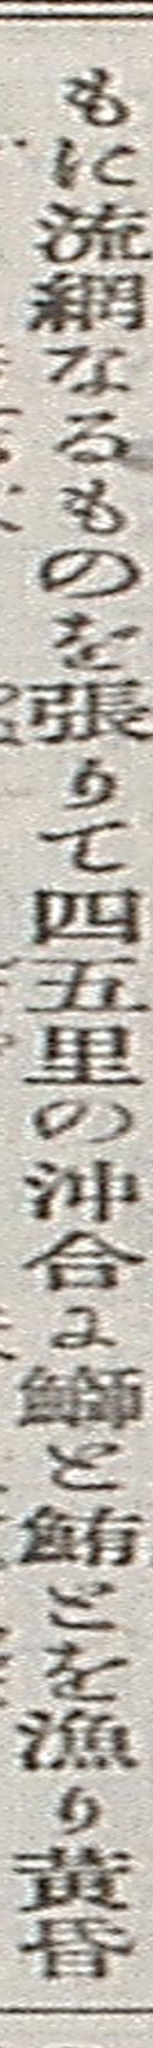もに流網なるものを張りて四五里の沖合に鰤と鮪とを漁り黄昏
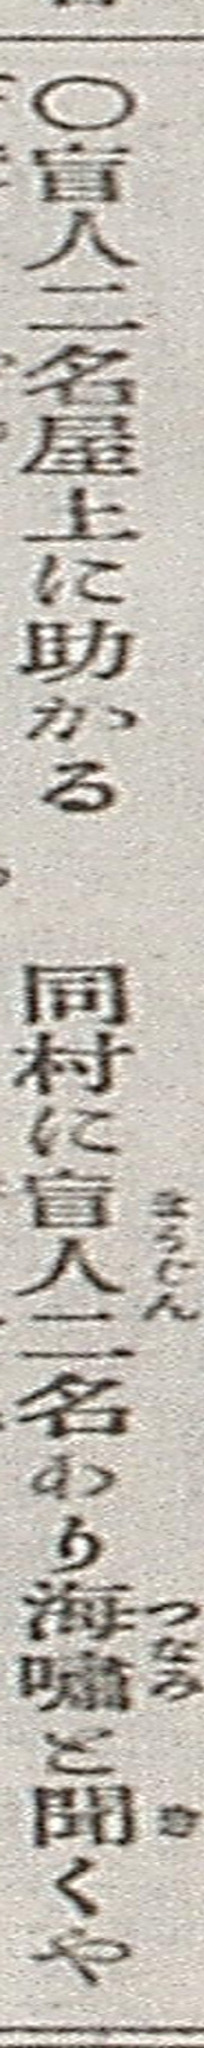○盲人二名屋上に助かる同村に盲人二名あり海嘯と聞くや
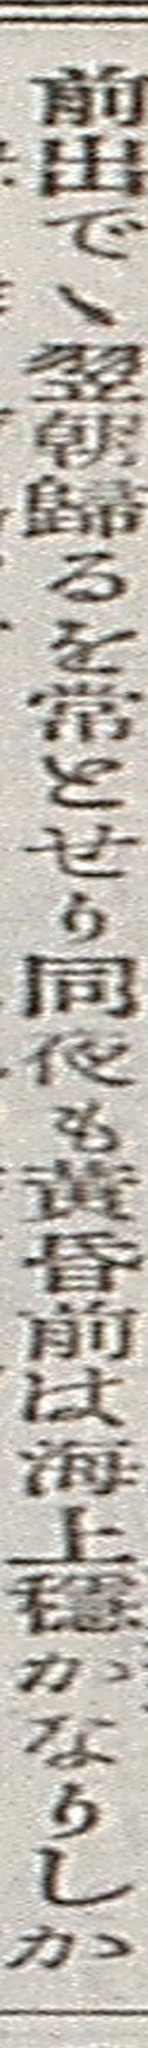前出でゝ翌朝帰るを常とせり同夜も黄昏前は海上穏かなりしか
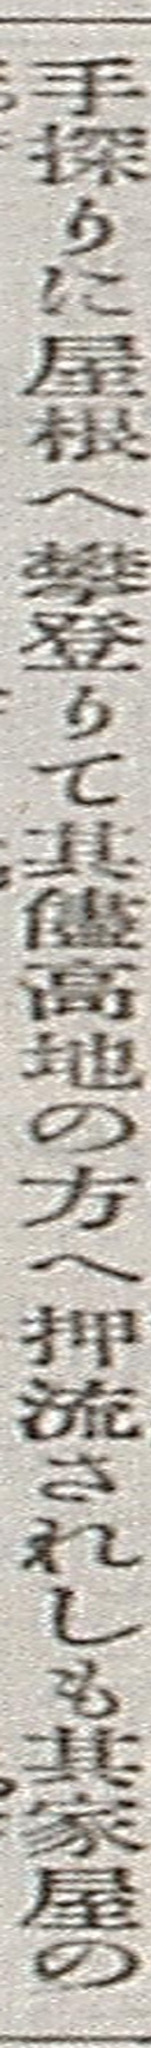手探りに屋根へ攀登りて其侭高地の方へ押流されしも其屋根の
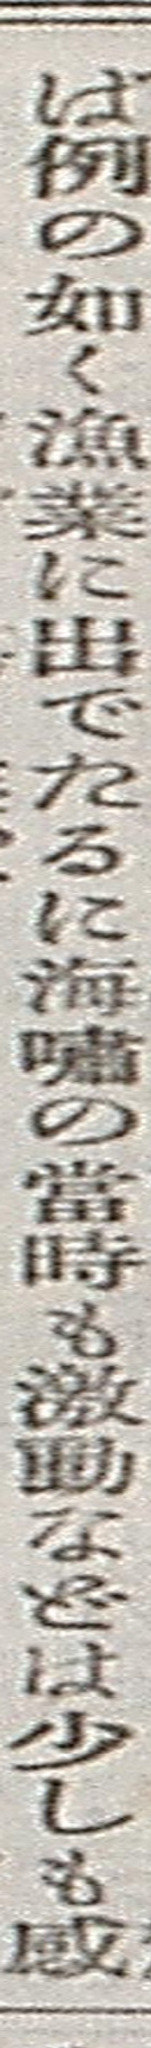ば例の如く漁業に出でたるに海嘯の当時も激動などは少しも感
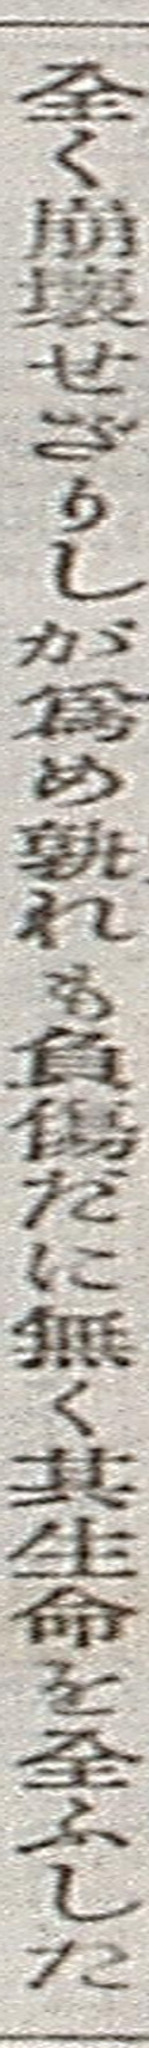全く崩壊せざりしが為め孰れも負傷だに無く其生命を全ふした
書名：風俗畫報臨時増刊第百二十號　大海嘯被害録（下）
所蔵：東京大学地震研究所図書室 Earthquake Research Institute Library, The University of Tokyo, JAPAN
